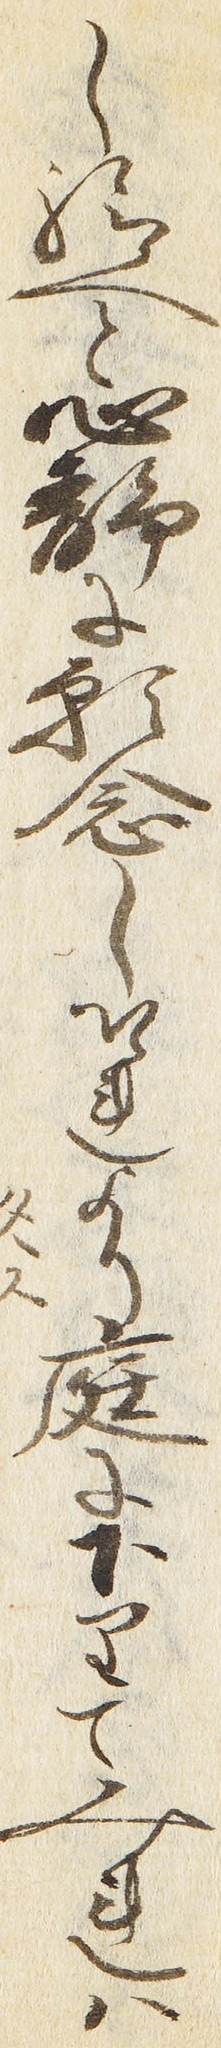し給へと心静に願念しそれより庭に下りてみれは
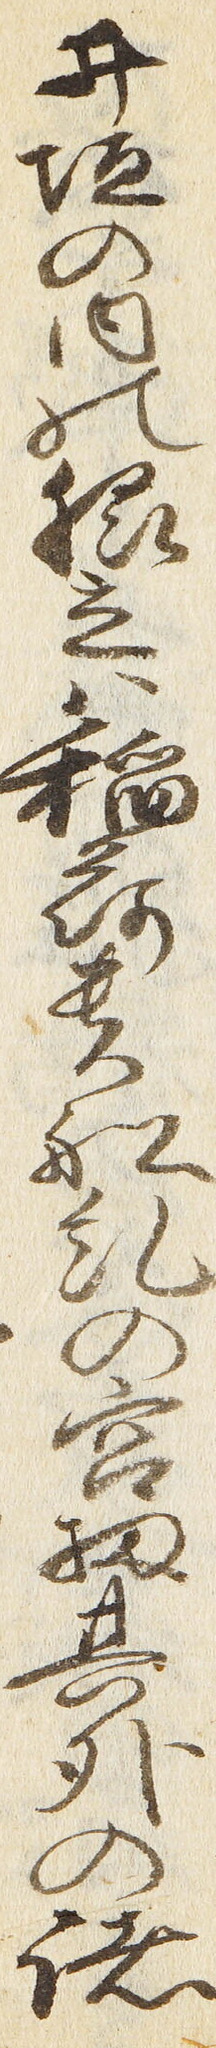井垣の内の脇立ハ稲荷貴船糺の宮扨其外の諸
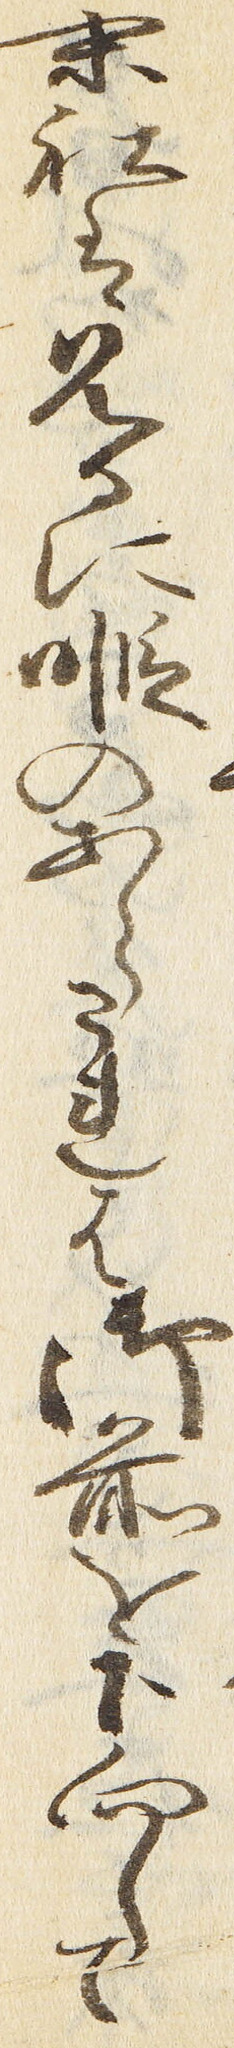末社は見るに暇のあらされは御前を下向して
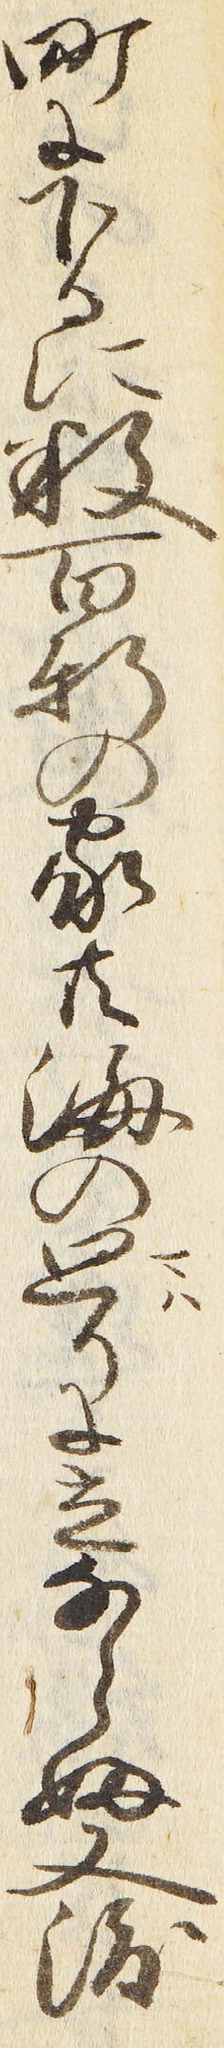町に下るに数百軒の家共海の廻りに立ならふ又渡
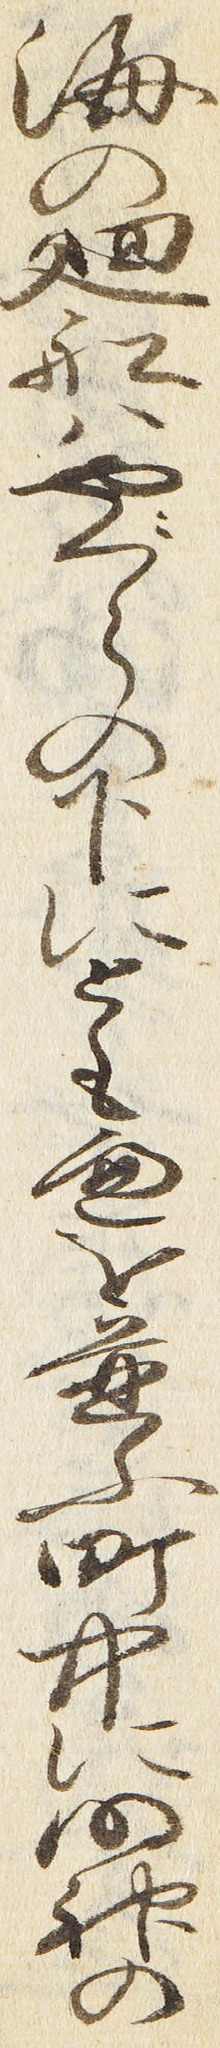海の廻船はやぐらの下にともへを並ふ町中に明神の
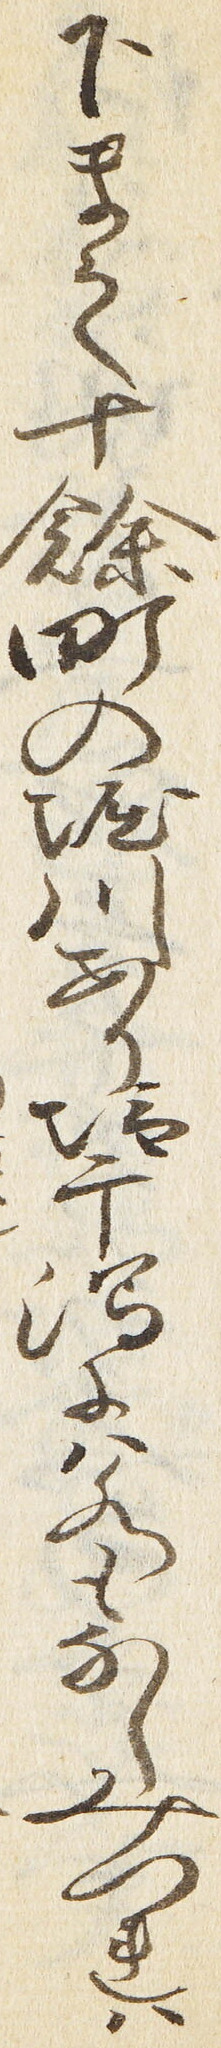下まえ十余町の堀川あり塩干潟には水もなしみつれは
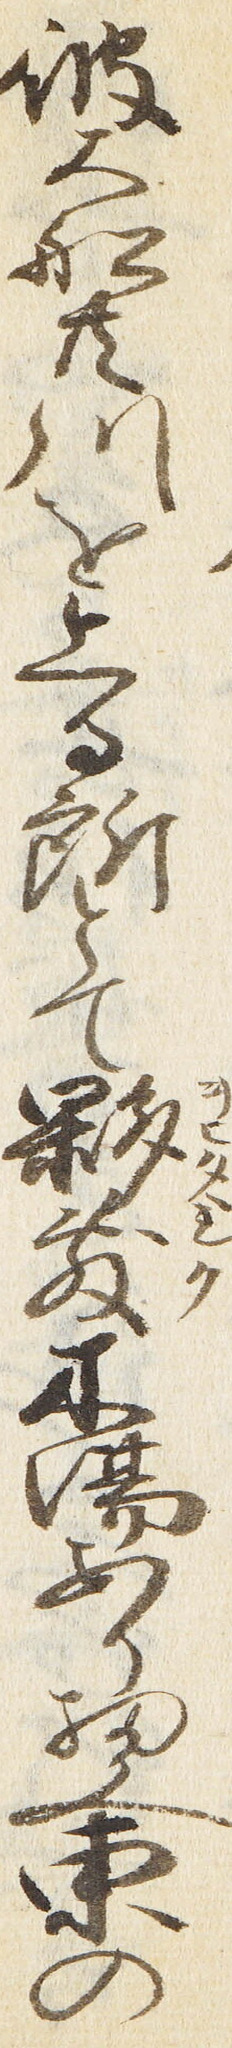彼大船共川を上る所とて夥敷木場あり扨又東の
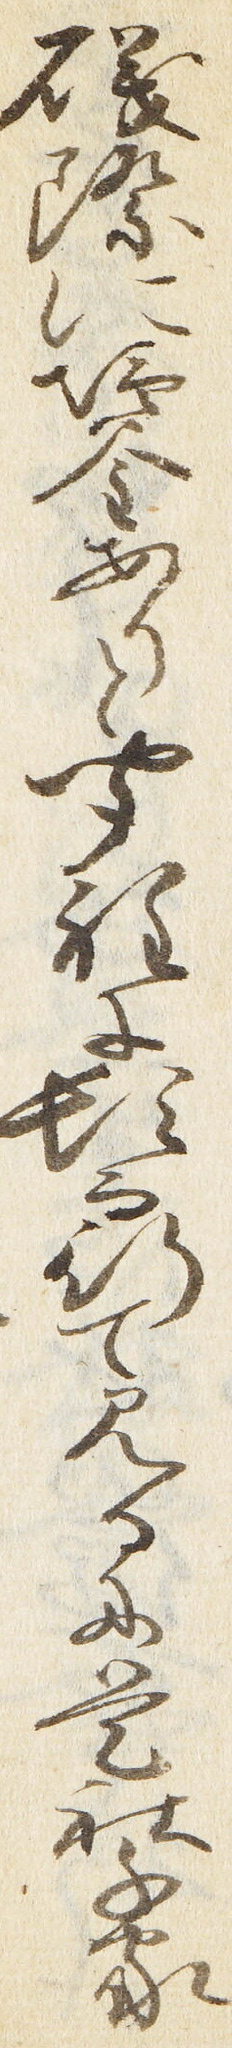磯際に塩釜ありと聞程に頓而行て見るに是社千家
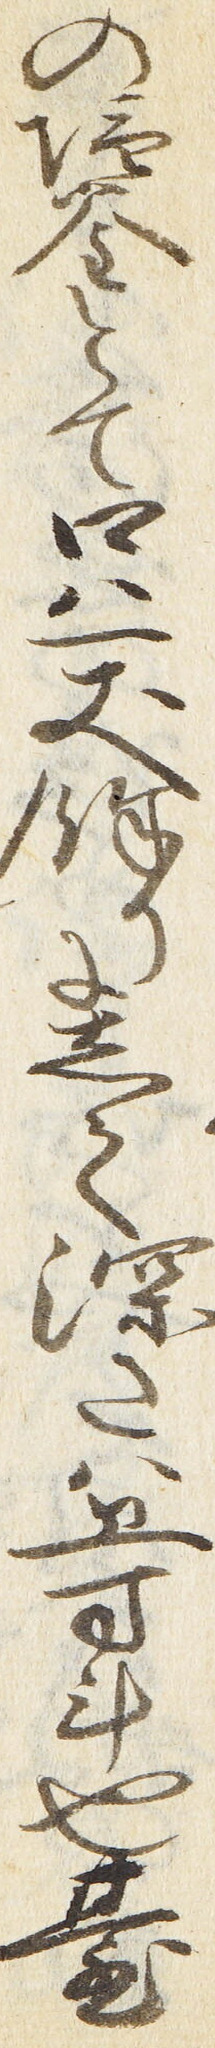の塩釜とて口ハ一丈余りにして深さは五寸計也台
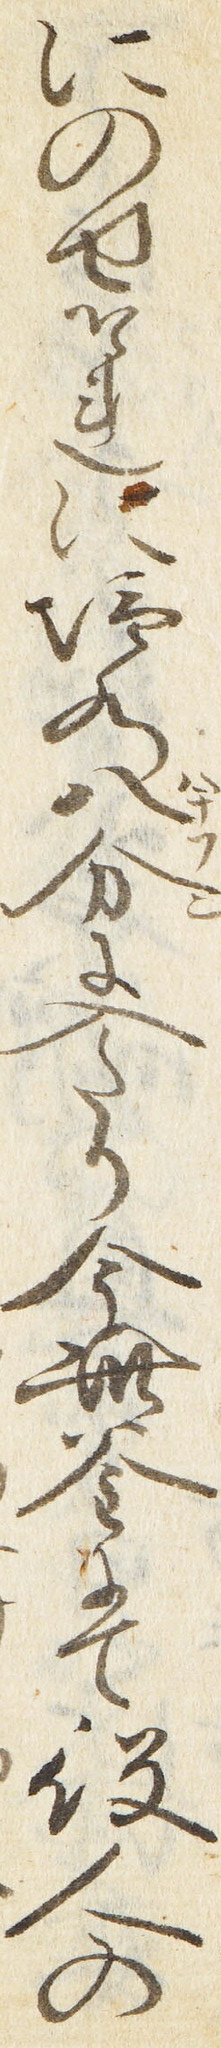にのせそれに塩水八分に入たり今此釜にて役人の
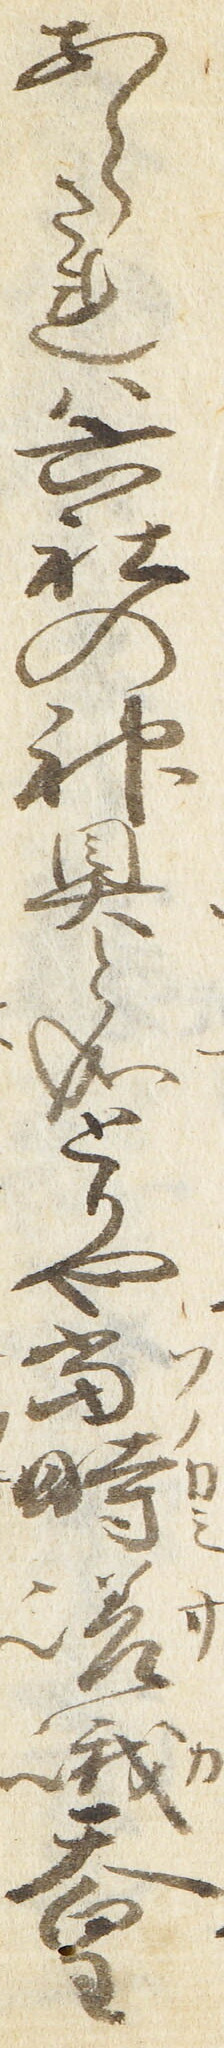あらされは六社の神具と成とかや当時嵯峨天皇
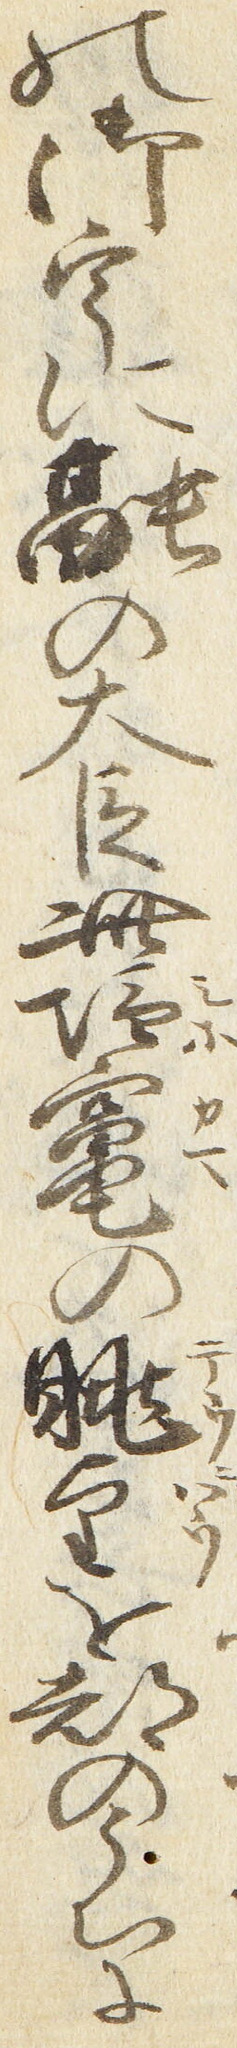の御宇に融の大臣此塩竃の眺望を都のうちに

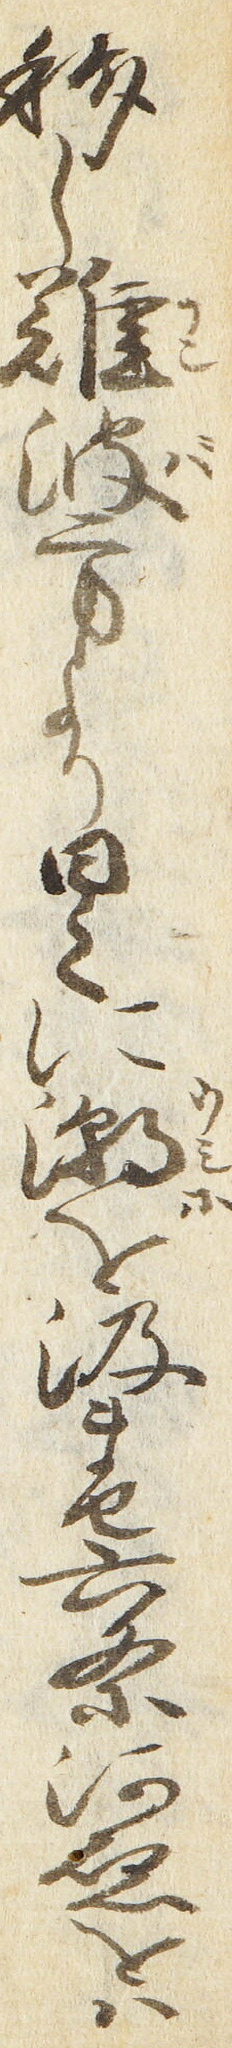移し難波方より日々に潮を汲ませ六条河原をは
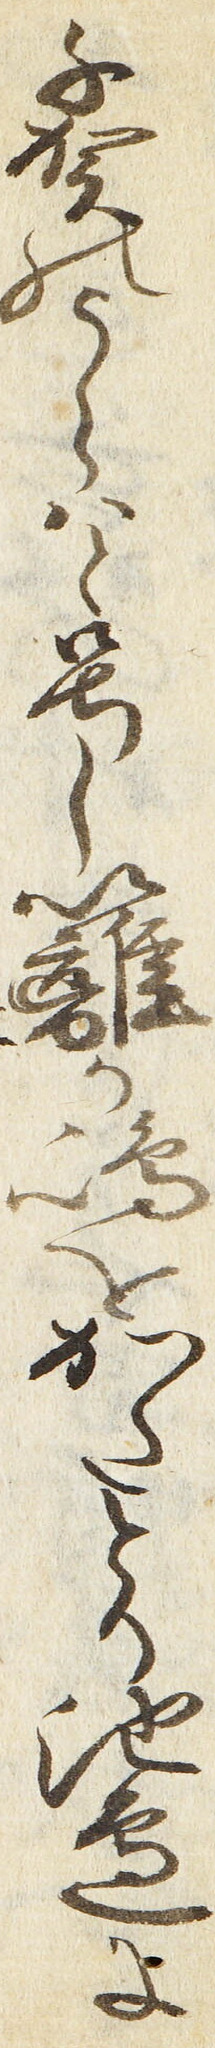千賀のうらはと号し籬か嶋をかたとり池辺に
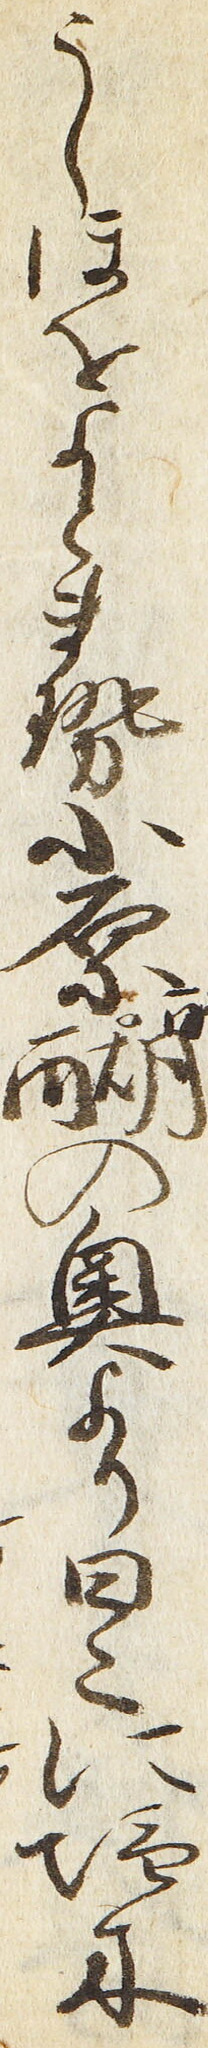うしほをよよくませ小原醍醐の奥より日々に塩木
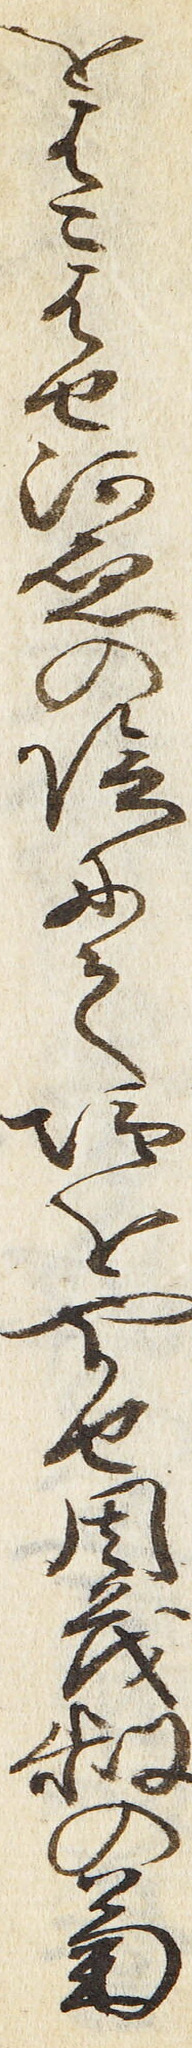をはこはせ河原の陰にて塩をやかせ周茂叔の菊
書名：海陸世話日記
